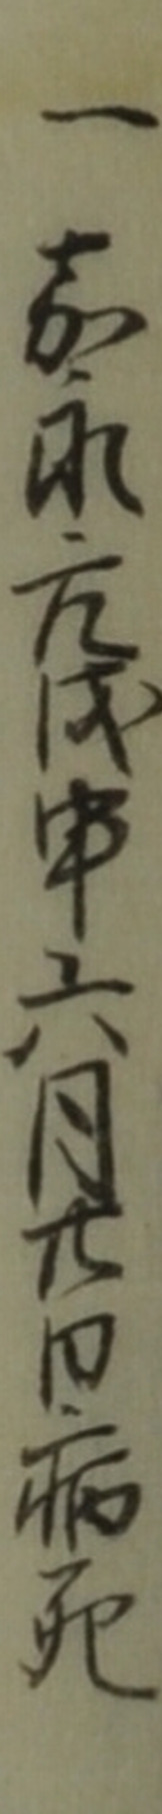一嘉永元戊申六月廿日病死
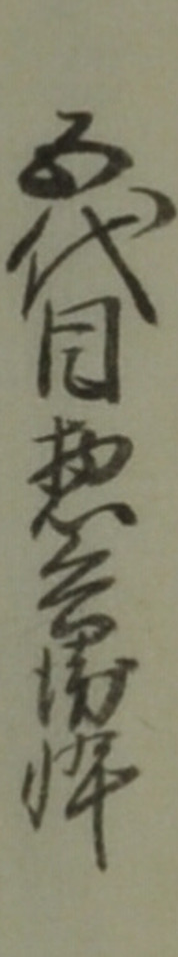五代目惣兵衛忰
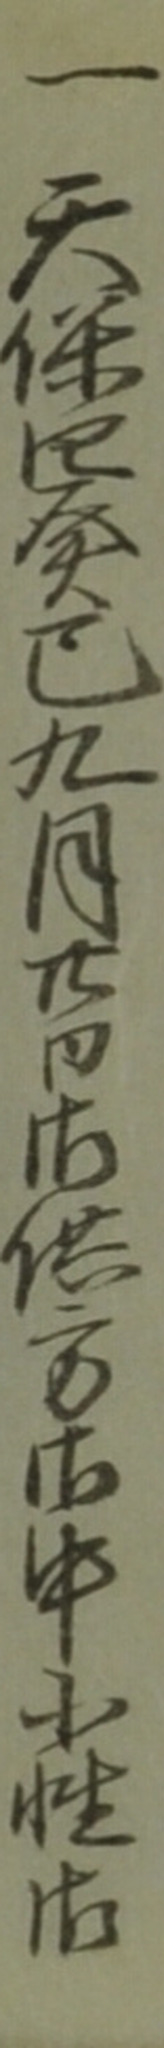一天保四癸巳九月廿日御供方御中小性御
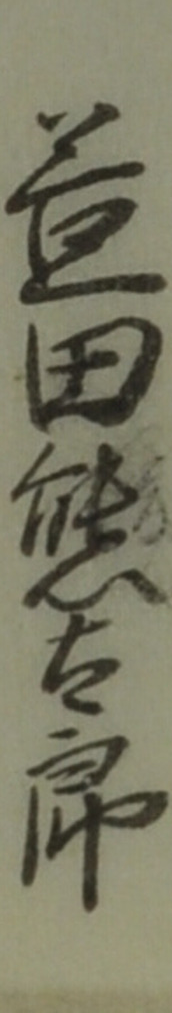益田熊太郎
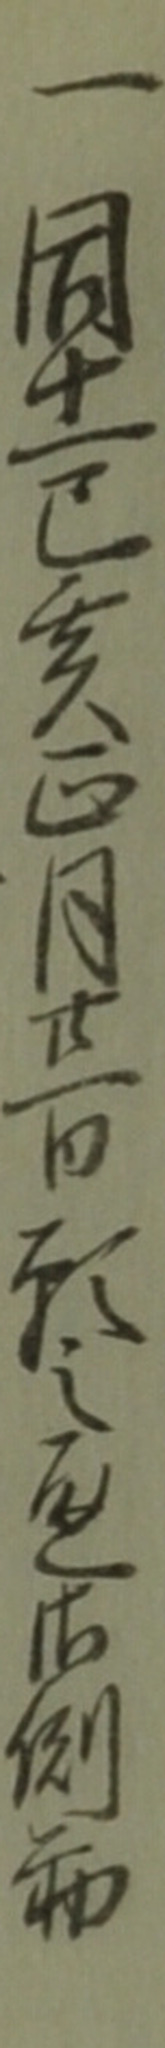一同十一巳亥正月廿一日願之通御側勤
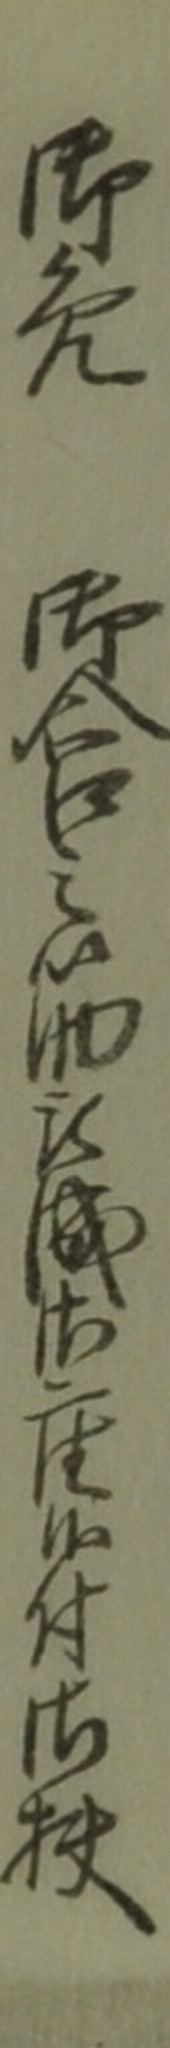御免御含之筋被成御座候付御扶
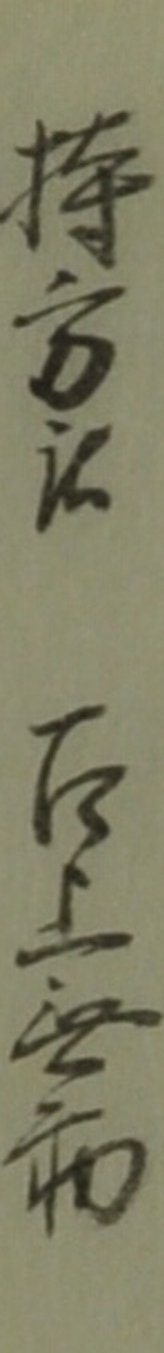持方被召上無物
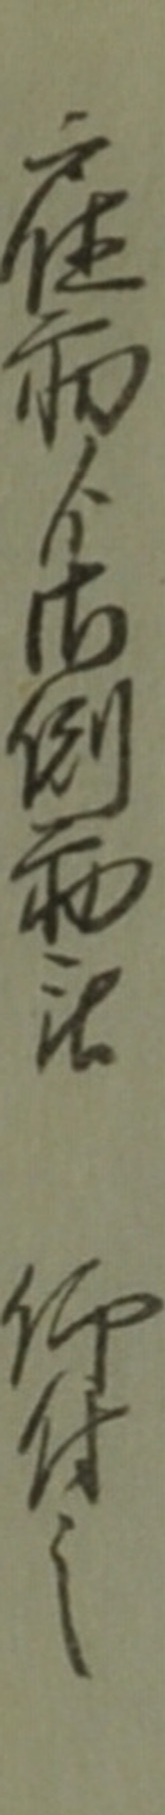雇勤ゟ御側勤被仰付之
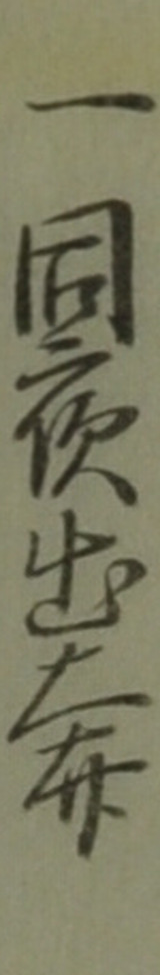一同夜出奔
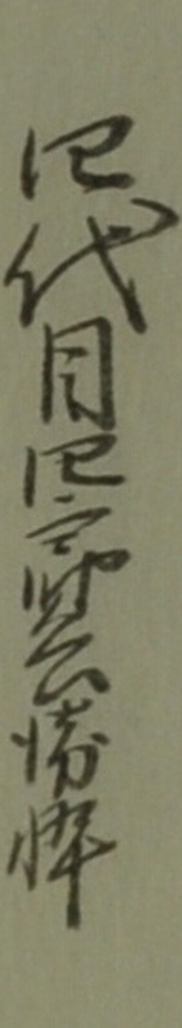四代目四郎兵衛忰
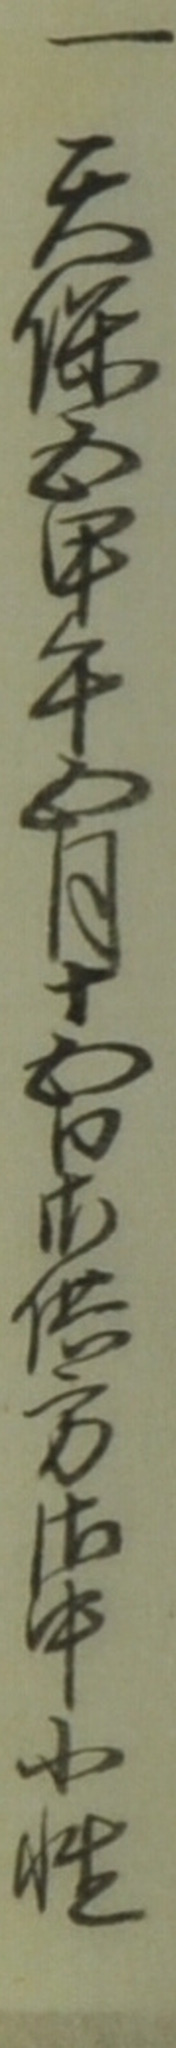一天保五甲午五月十五日御供方御中小性
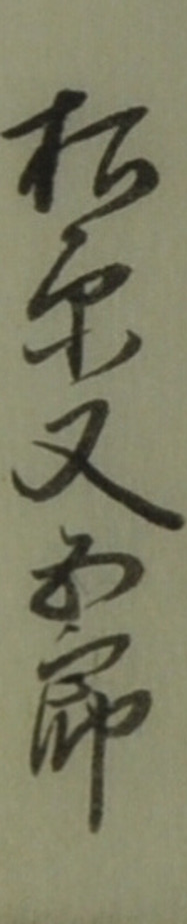松原又五郎

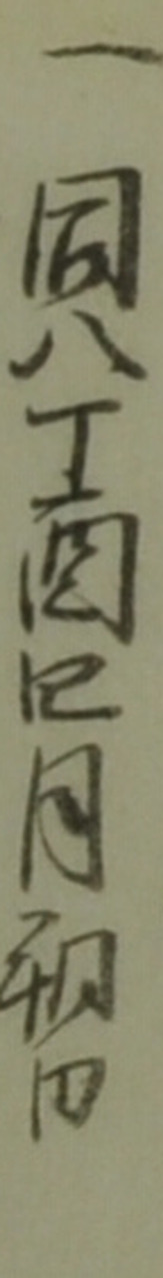一同八丁酉四月朔日
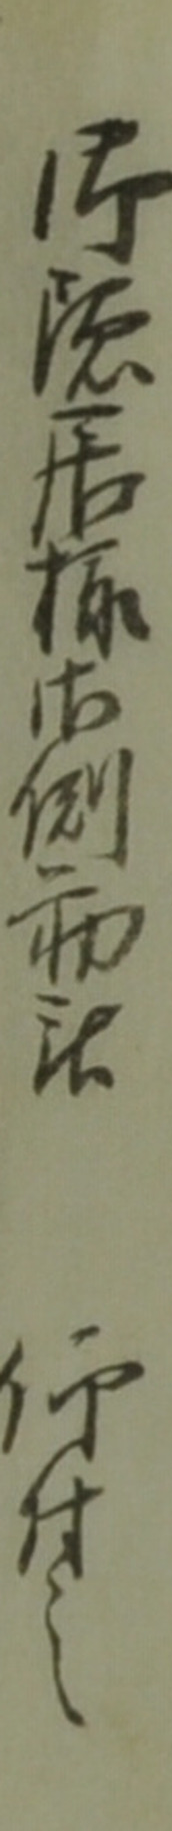御隠居様御側勤被仰付之
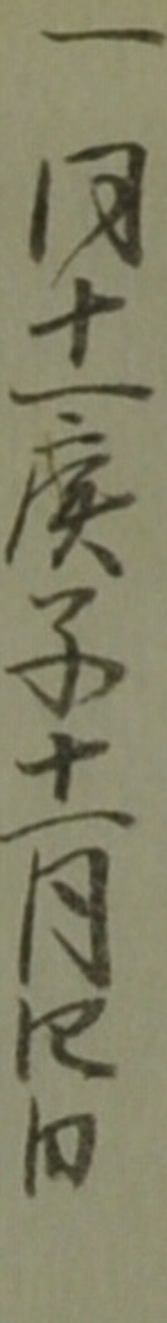一同十一庚子十一月四日
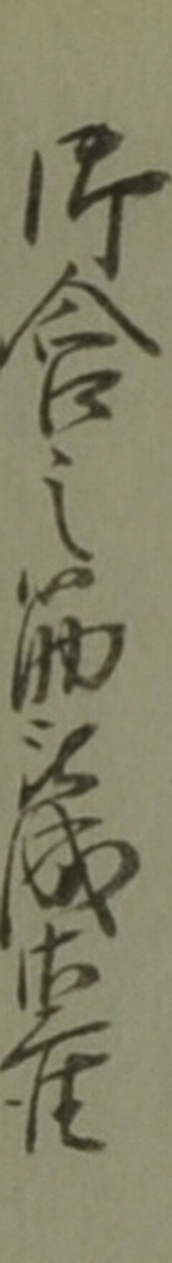御含之筋被成御座
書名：諸御役代々録（五）
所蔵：伊那市立高遠町図書館・合同会社AMANE
